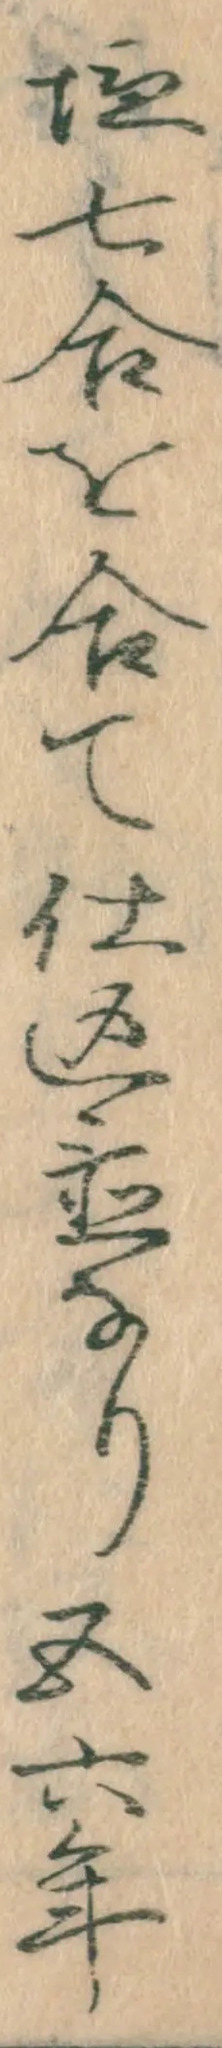塩七合を合て仕込置なり五六年
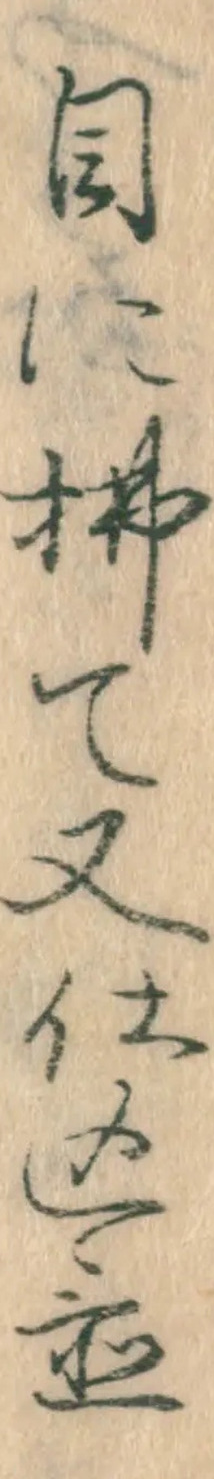目に払て又仕込置
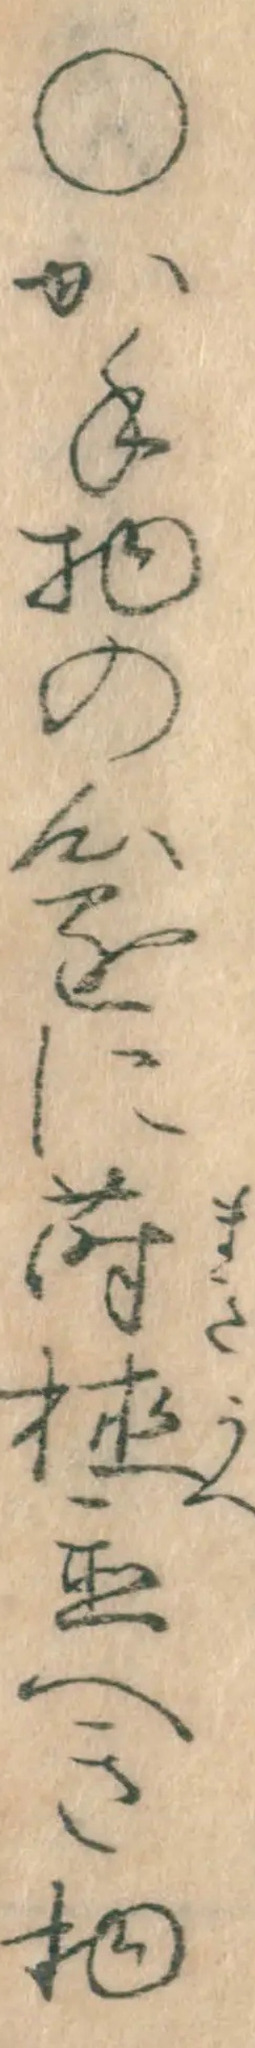○かて物の心懸に蒔植置へき物

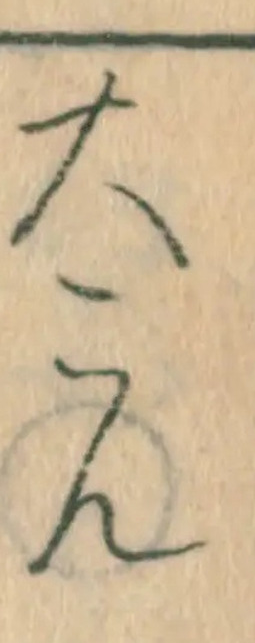大こん
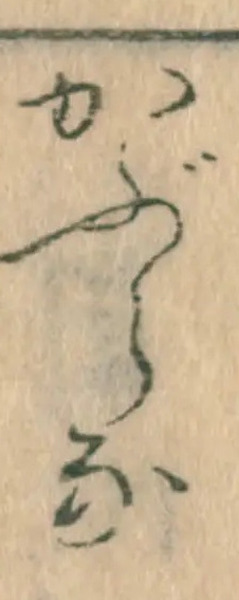かぶらな
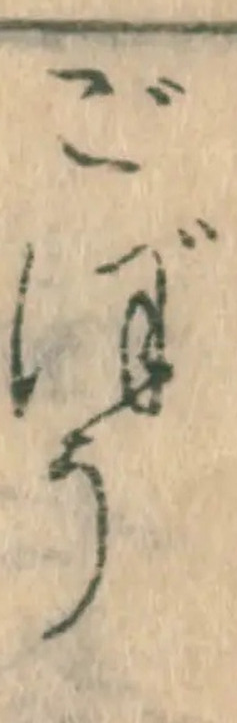ごぼう
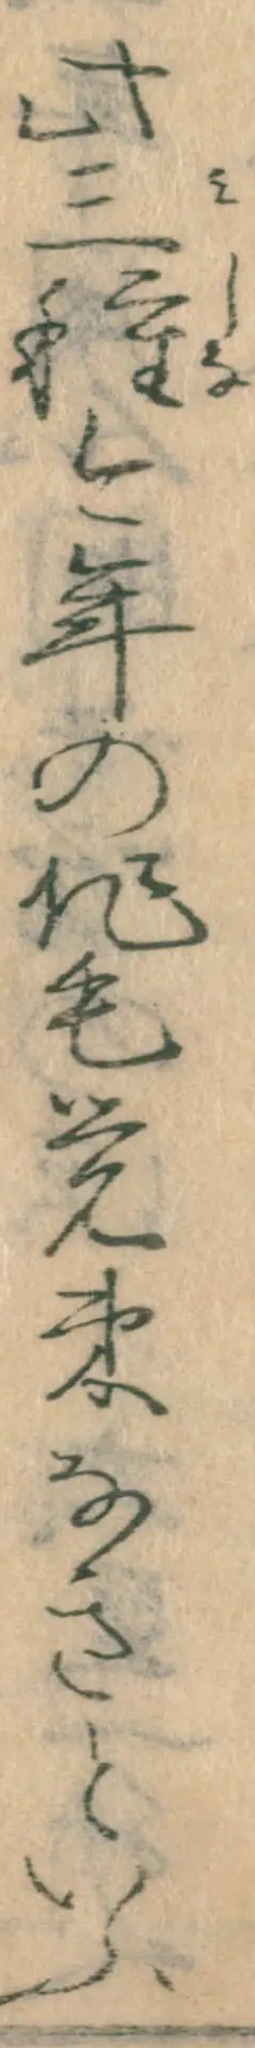此三種今年の作毛覚束なきといふ
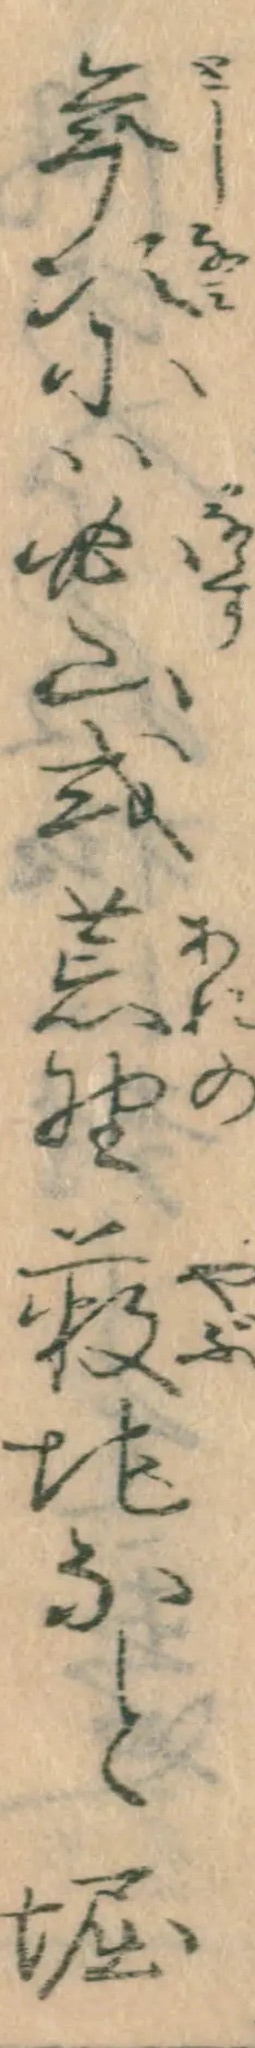年次には必山或荒野藪地なと堀
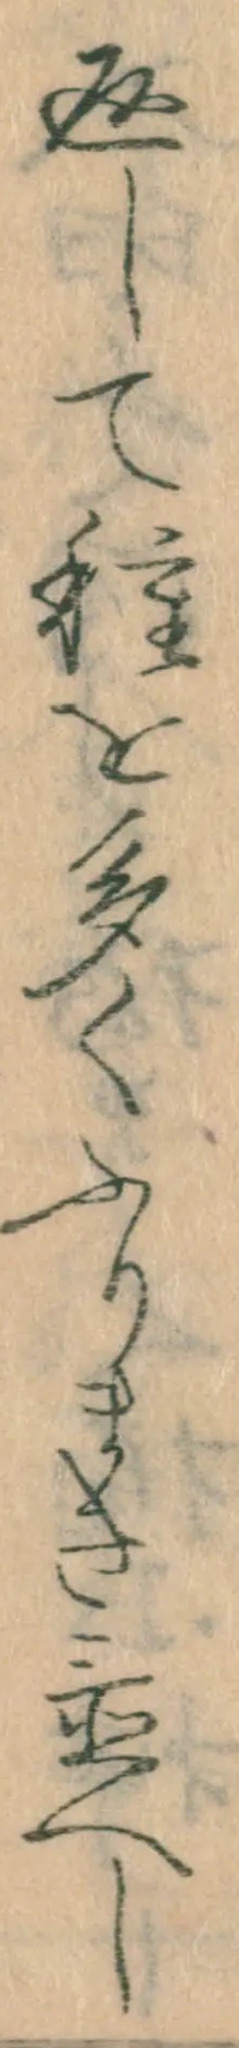返して種を多くふりまき置へし
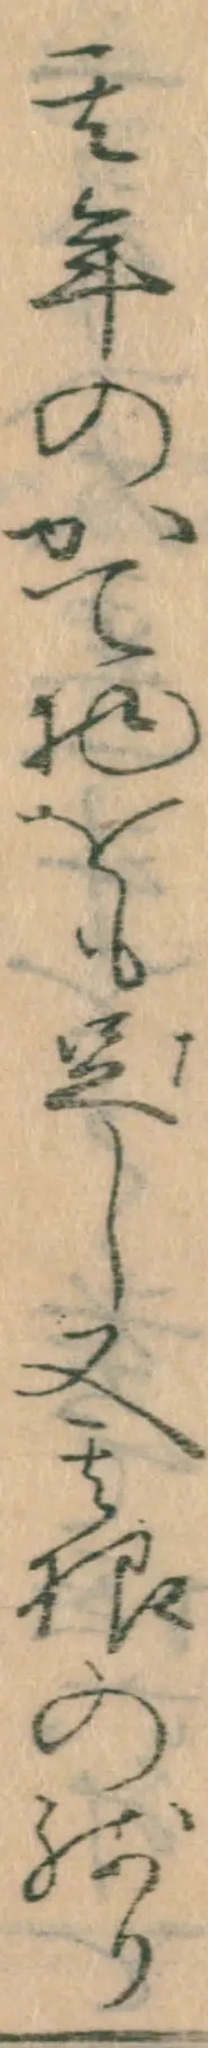其年のかて物をも足し又其根の残り
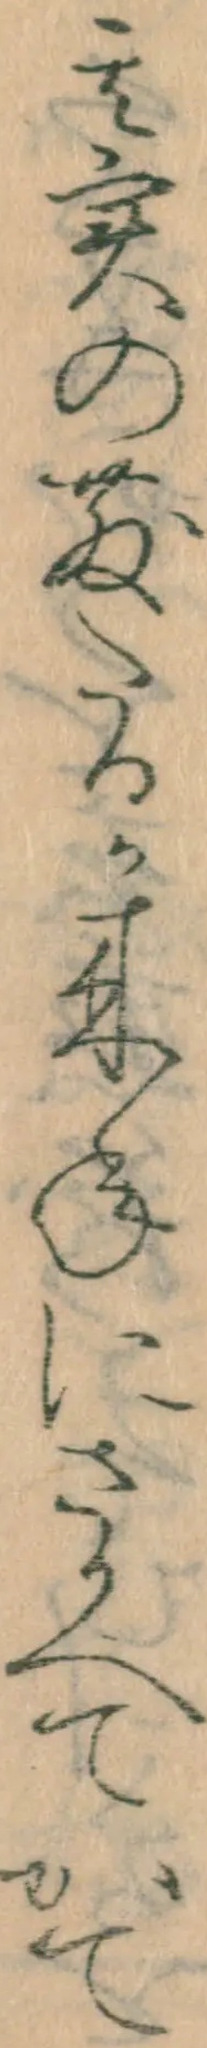其実の散たるか来年にさかへてかて
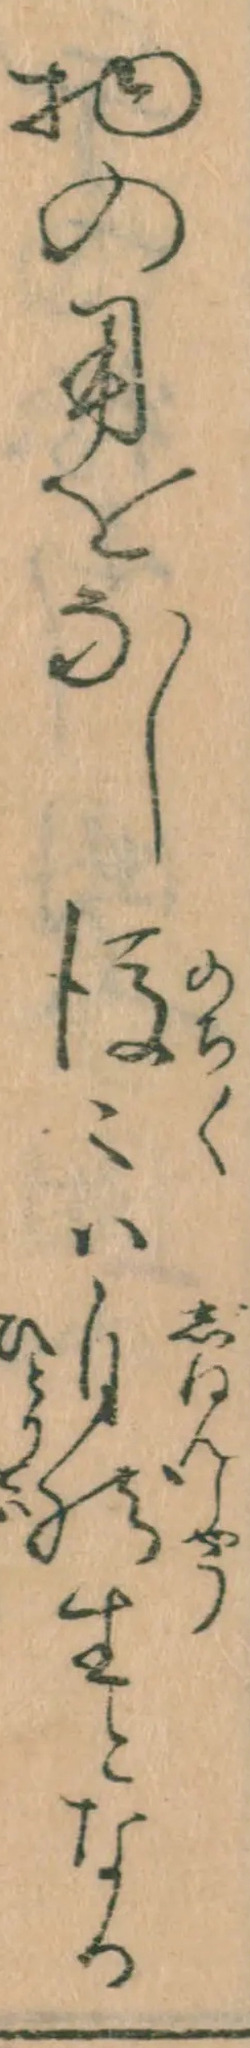物の用をなし後々は自然生となる
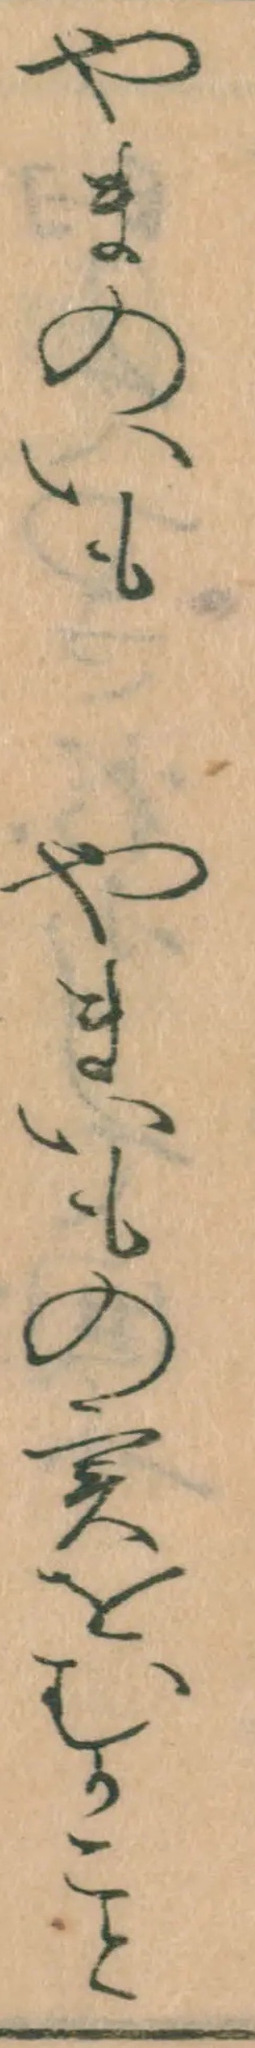やまのいもやまいもの実をむかこと
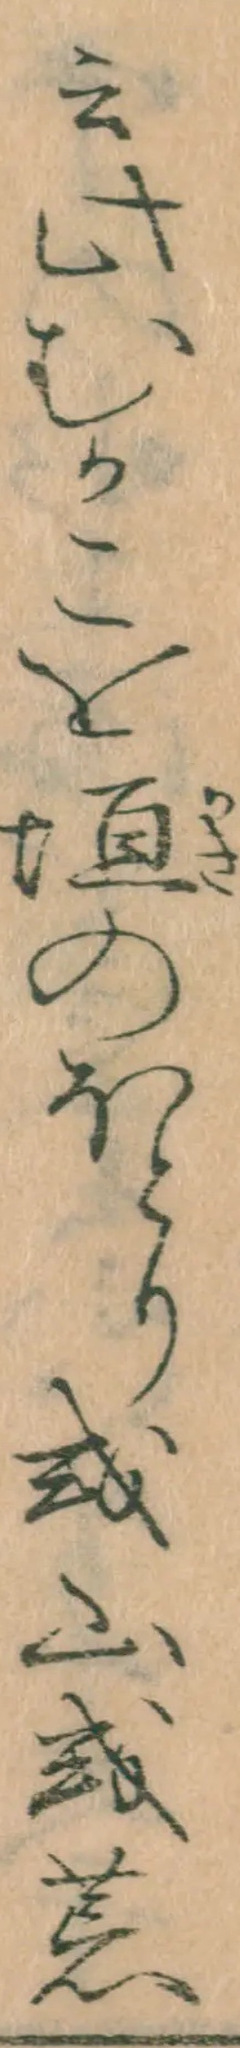云此むかこを垣のほとり或山或荒
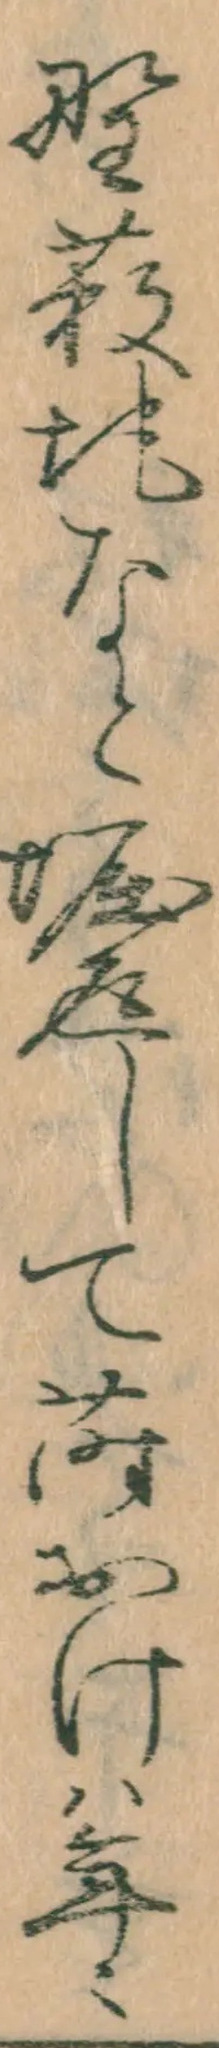野藪地なと堀返して蒔おけは年々
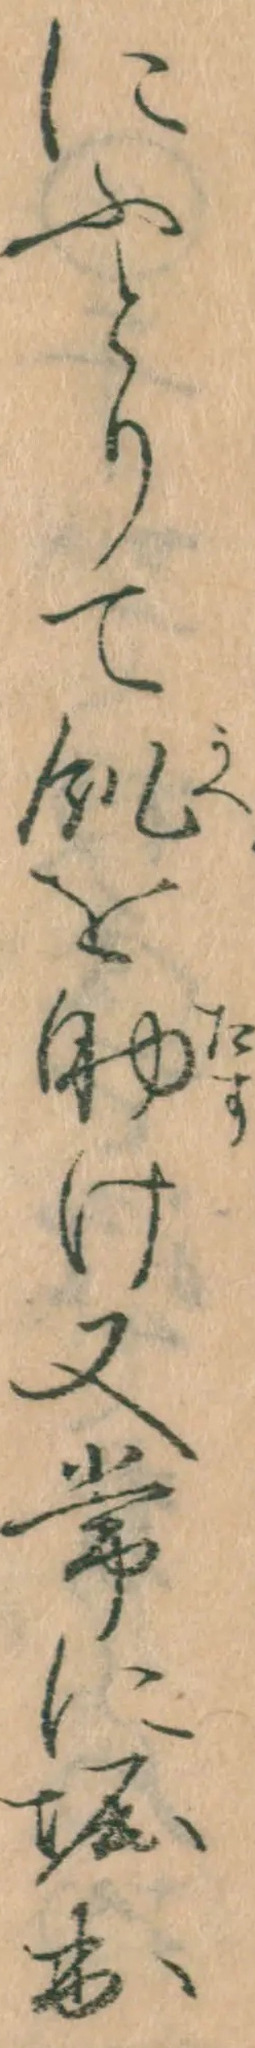にふとりて飢を助け又常に堀出
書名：かてもの
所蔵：国立国会図書館 National Diet Library, JAPAN
